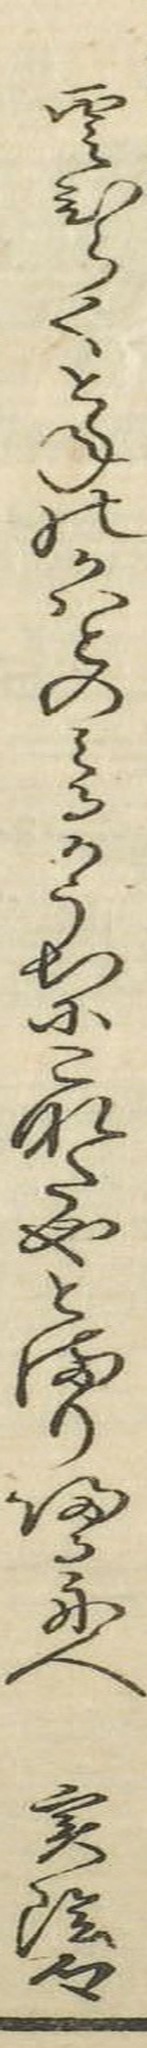雲ひらくとねのかはとのみるかうちにこなたやとまり帰る舟人実陰卿
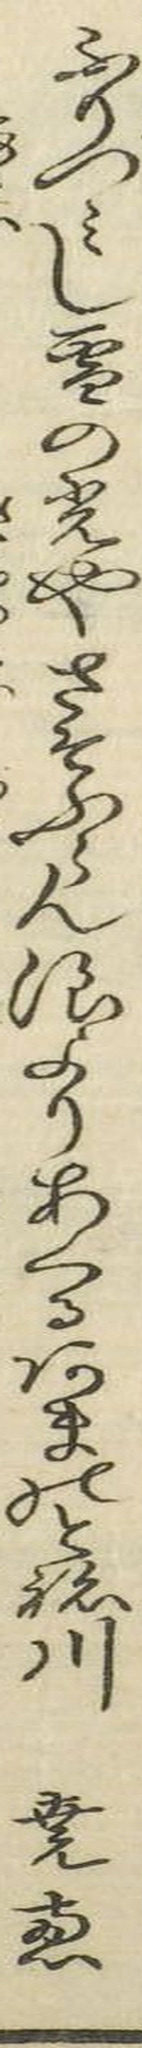ふりつみし雪の光やさそふらん浪よりあくるあまのとね川尭恵
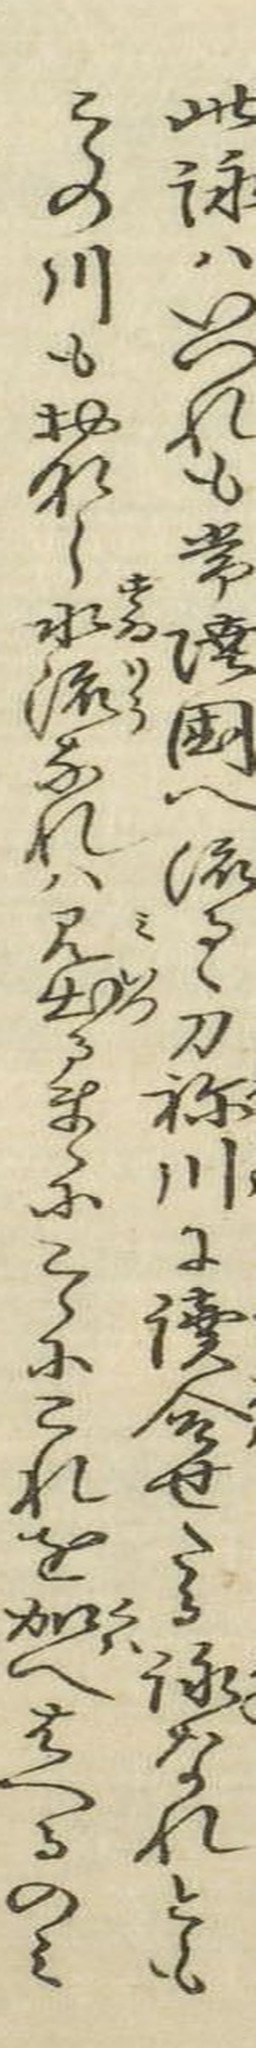こゝの川もおなし水流なれは見出るまゝにこゝにこれを加へはへ？るのみ
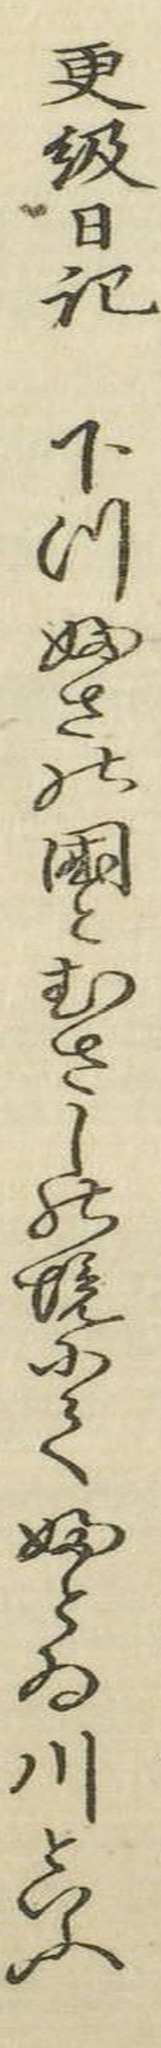更級日記下つふさの国とむさしの境にてふとゐ川といふ
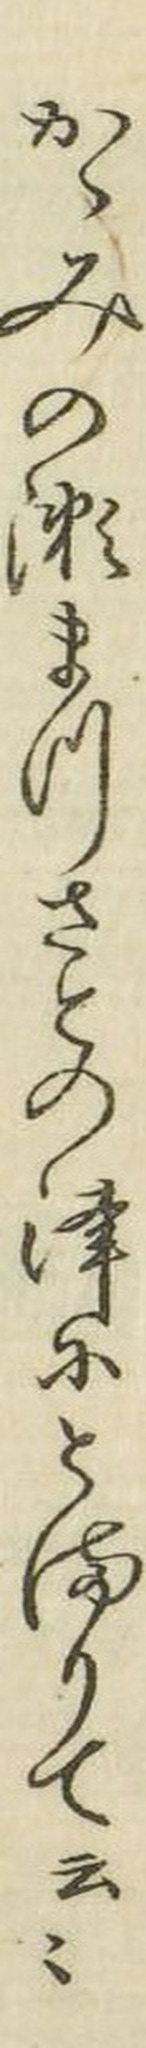かゝみの瀬まつさとの津にとまりて云々
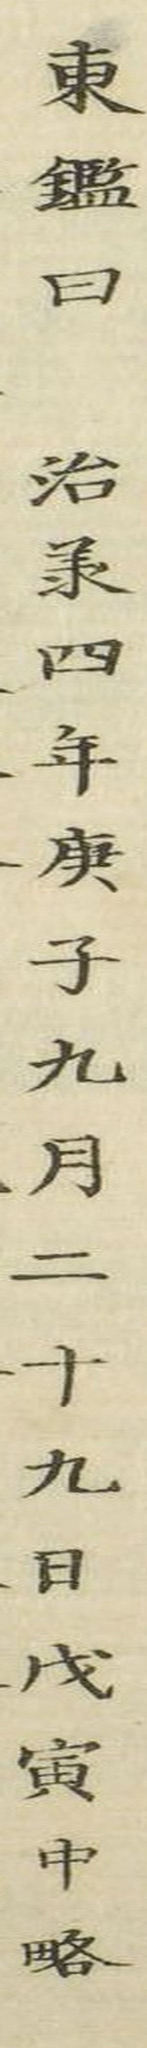東鑑曰治承四年庚子九月二十九日戊寅中略
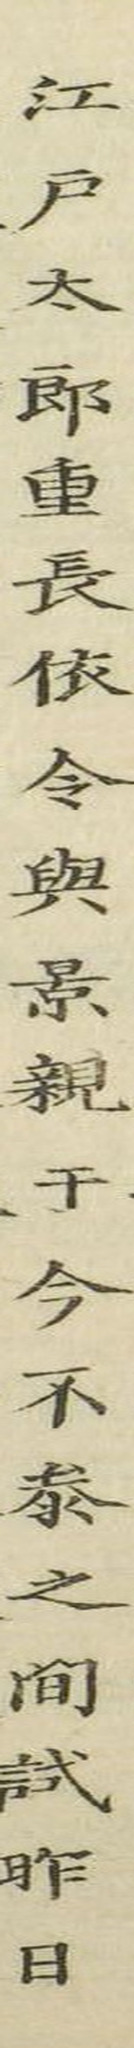江戸太郎重長依令与景親干今不参之間試昨日
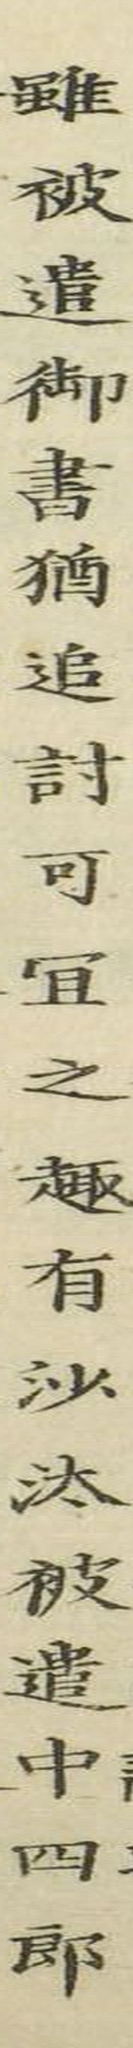雖被遣御書猶追討可宜之趣有沙汰被遣中四郎
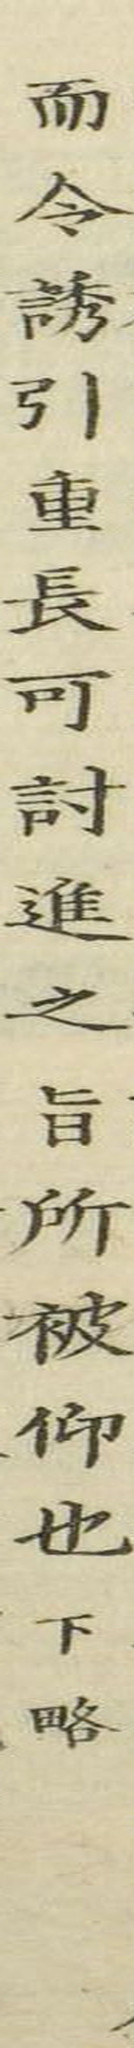而令誘引重長可討進之旨所被仰也下略
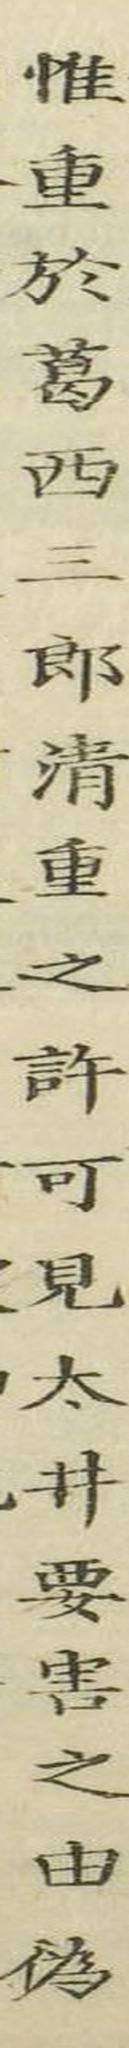惟重於葛西三郎清重之許可見大井要害之由僞
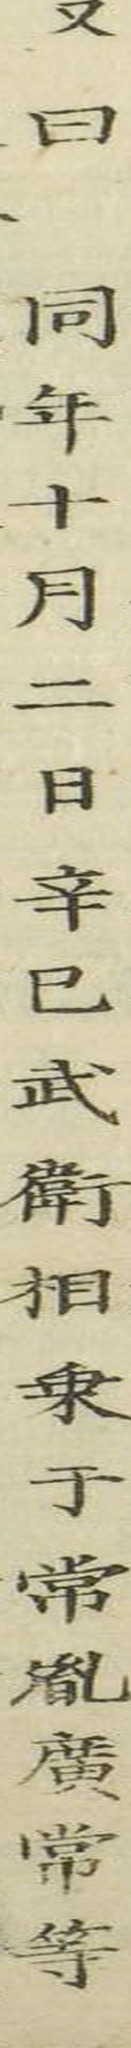又曰同年十月二日辛巳武衛相乗于常胤広常等
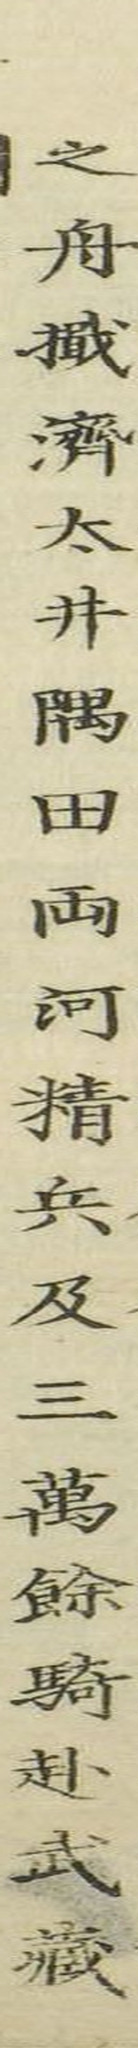之舟檝済太井隅田両河精兵及三万余騎赴武蔵
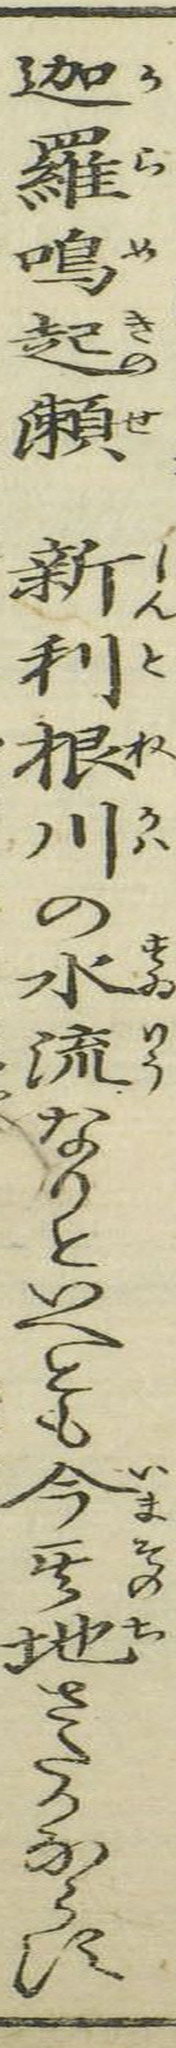迦羅鳴起瀬新利根川の水流なりといへとも今其地さたかならす
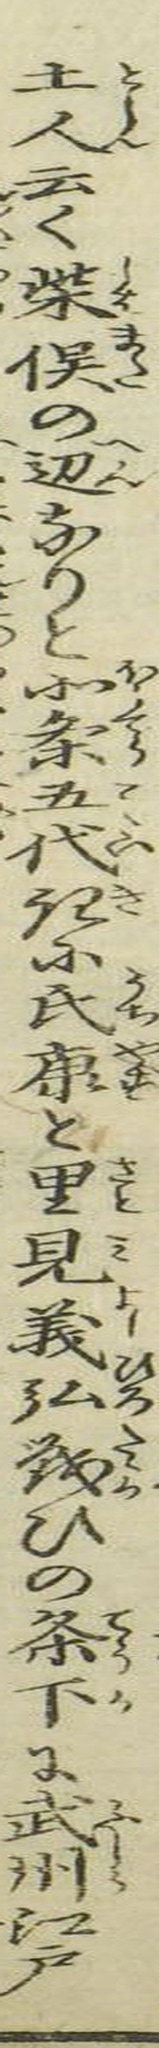土人云く柴俣の辺なりと北条五代記に氏康と里見義弘戦ひの条下に武州江戸
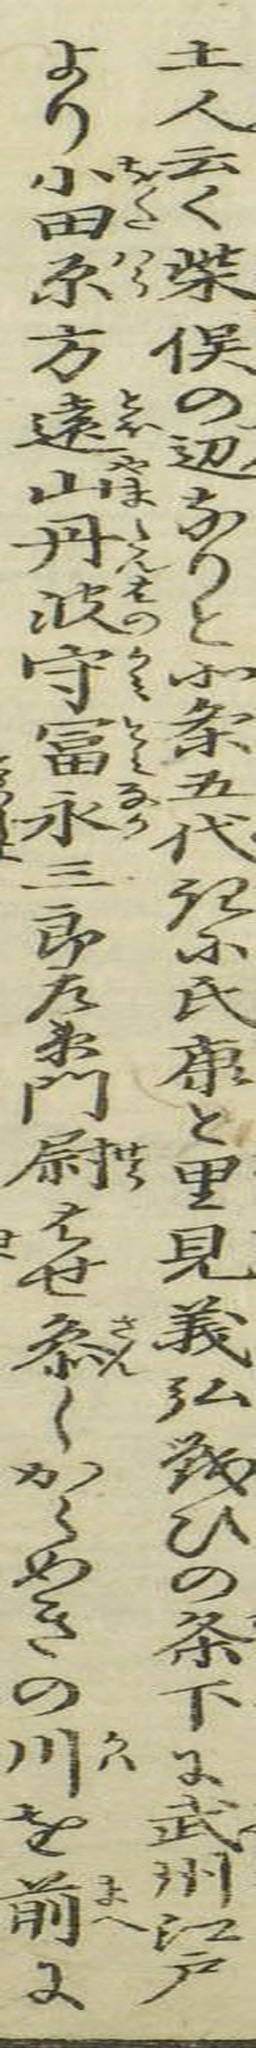より小田原方遠山丹波守富永三郎左衛門尉はせ参しからめきの川を前に
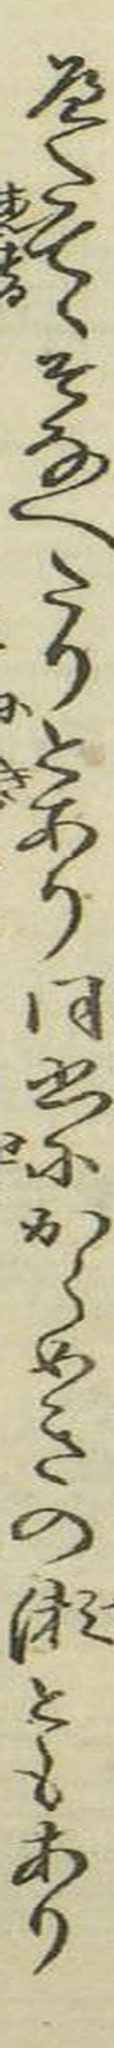へたてゝそなへたりとあり同書にからめきの瀬ともあり
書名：江戸名所図会 20巻 巻之20
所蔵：東京学芸大学教育コンテンツアーカイブ
